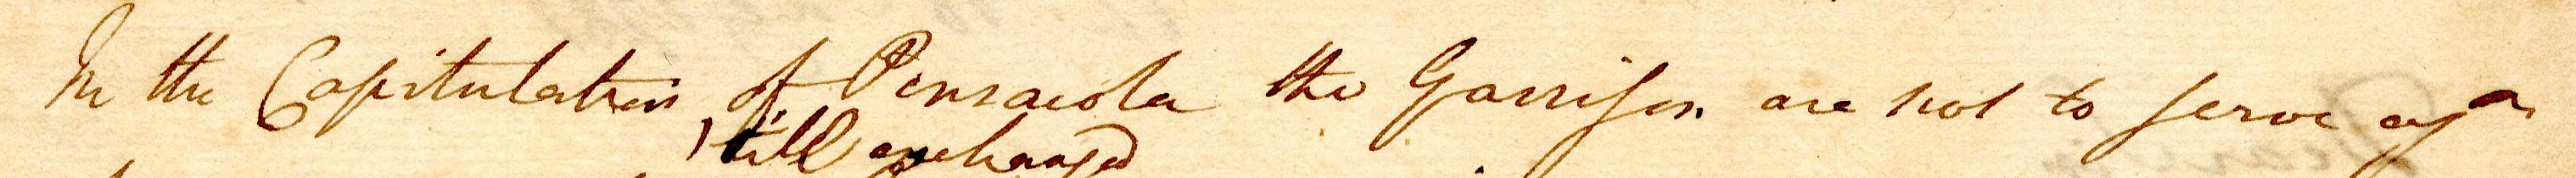In the Capitulation of Pensacola the Garrison are not to serve y^e
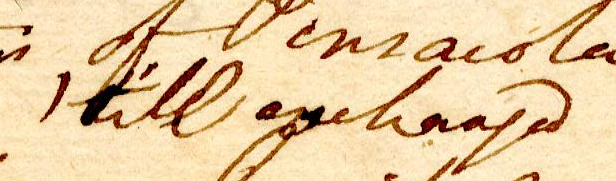still exchanged
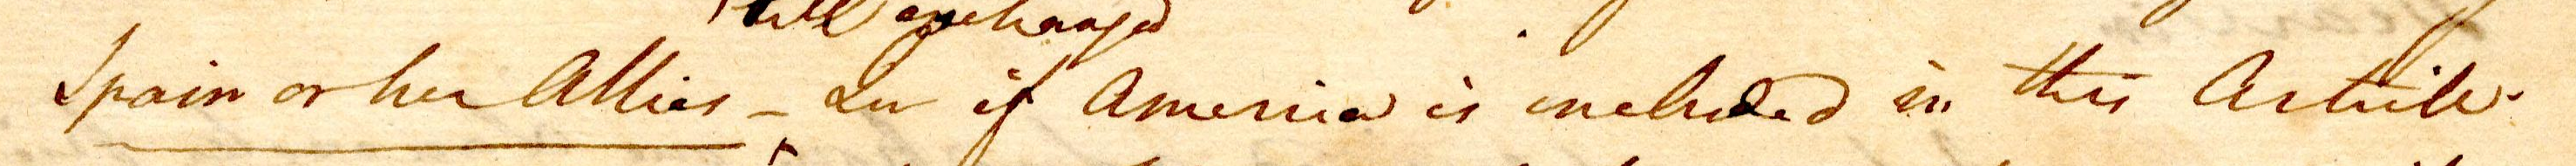Spain or her Allies. In if America is included in the Article
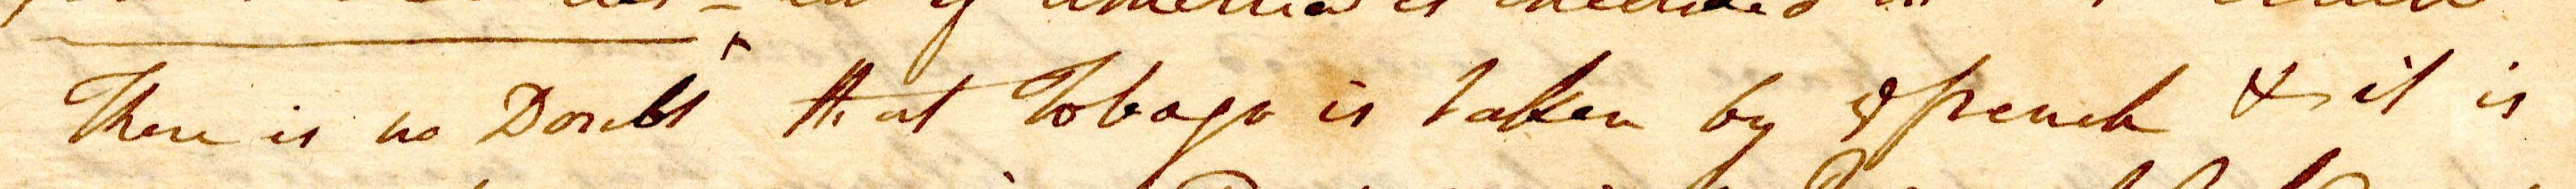There is no Doubt that Tobago is taken by y^e peach & it is
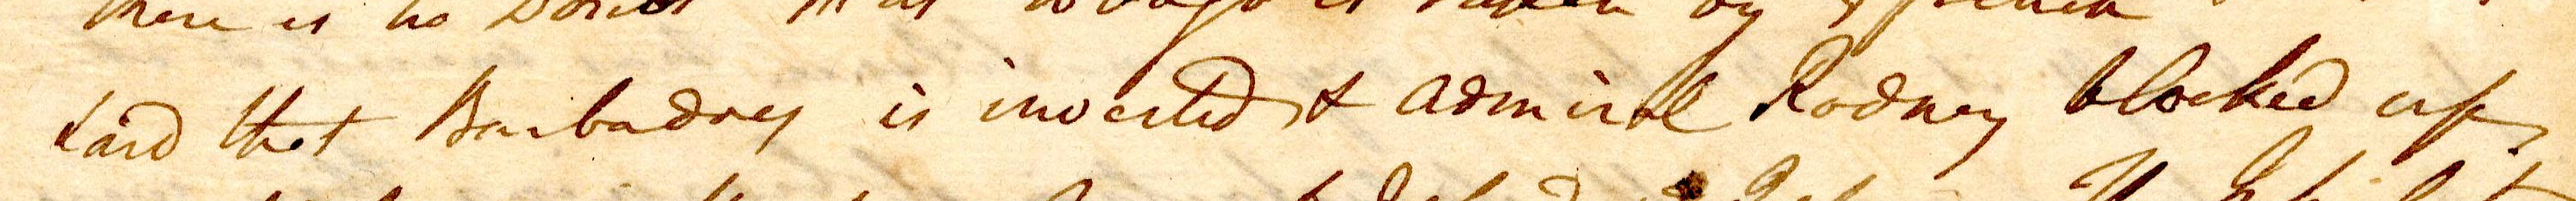said that Barbadoes is inverted & Admiral Rodney blocked up
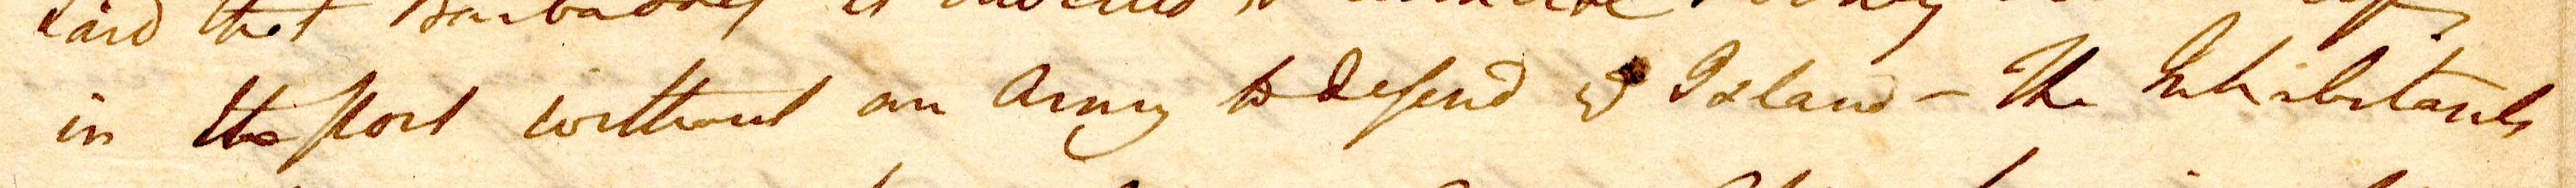in the port without an Army to defend y^e Island. The Inhabitants
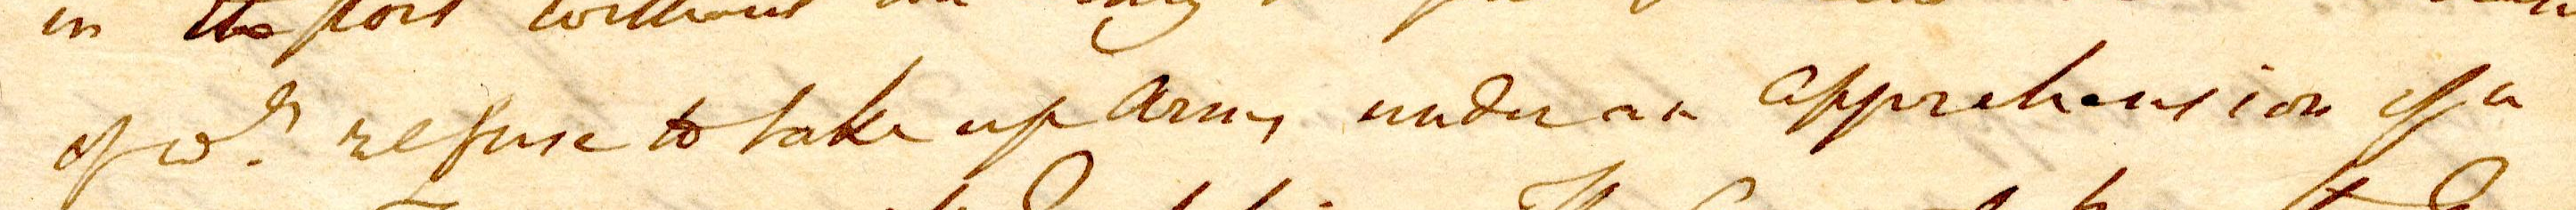of w^h refuse to take up Arms under an Apprehension of a
